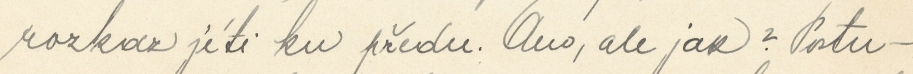rozkaz jíti ku předu. Ano, ale jak? Postu-
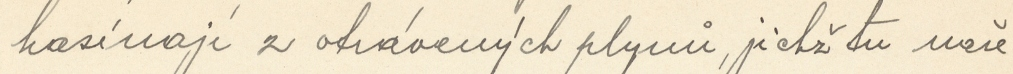hasínají z otrávených plynů, jichž tu naše
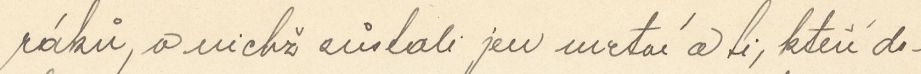ráků, v nichž zůstali jen mrtví a ti, kteří do-
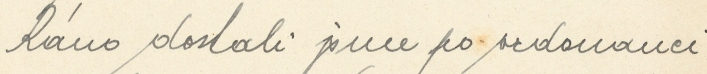Ráno dostali jsme po ordonanci
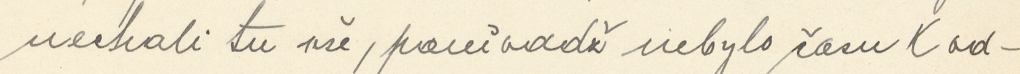nechali tu vše, poněvadž nebylo času k od-
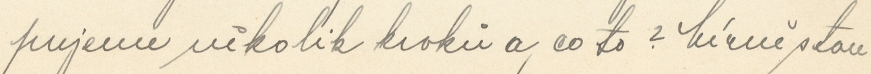pujeme několik kroků a co to? Mírně stou-
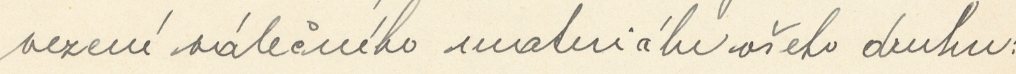vezení válečného materiálu všeho druhu:
